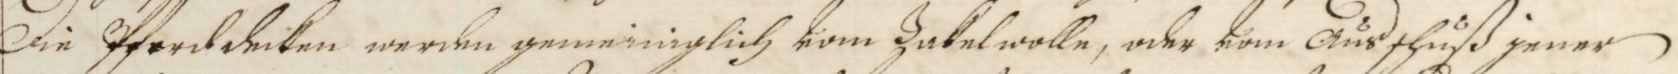Die Pferddecken werden gemeiniglich vom Zakelwolle, oder vom Ausschuß jener
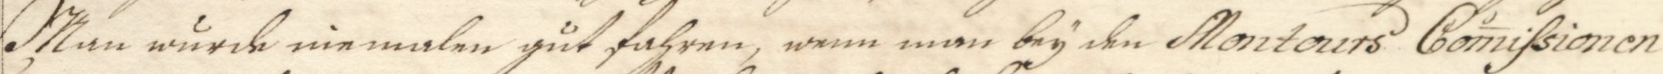Man wurde niemalen gut fahren, wenn man bey den Montours Commissionen
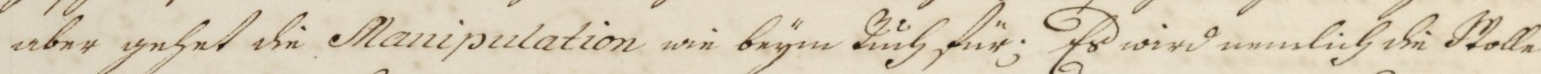aber gehet die Manipulation wie beym Tuch für. Es wird nemlich die Wolle
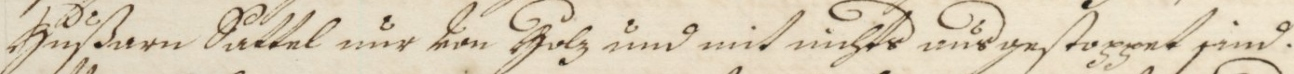Hußarn Sattel nur von Holz und mit nichts ausgestoppet sind.
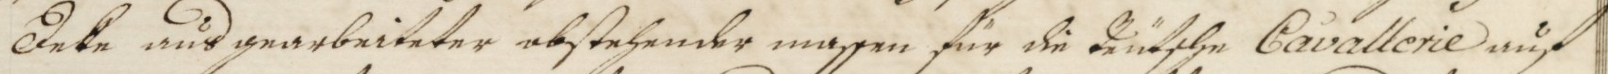Deke ausgearbeiteter obstehender massen für die Teütsche Cavallerie auf
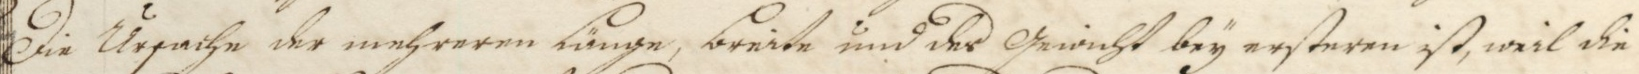Die Ursache der mehreren Länge, Breite und des Gewicht bey ersteren ist, weil die
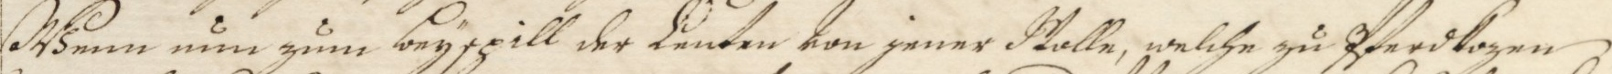Wenn nun zum Beyspill der Centen von jener Wolle, welche zu Pferdkozen
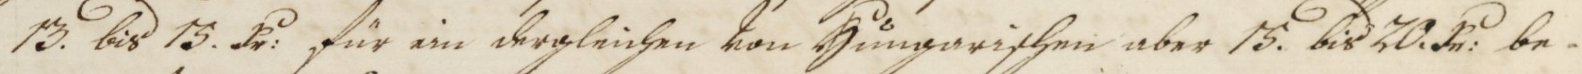13. bis 15. Xr. für ein dergleichen von Hungarischen aber 15. bis 20. Xr. be-
